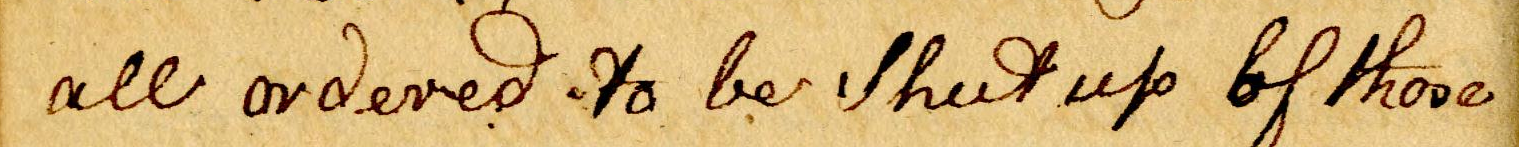all ordered to be shut up of those
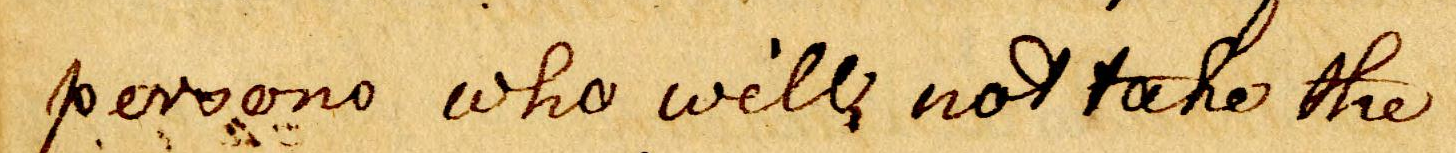persons who will not take the
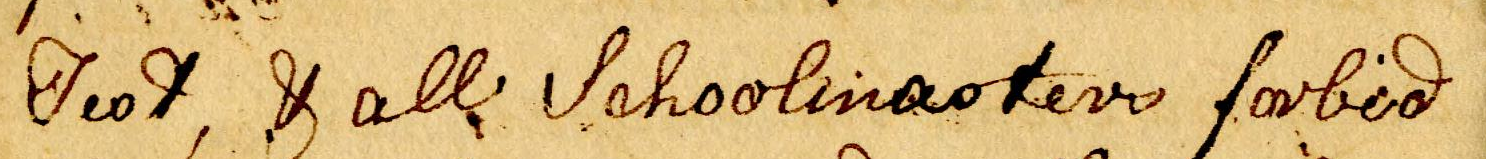Test, & all Schoolmasters forbid
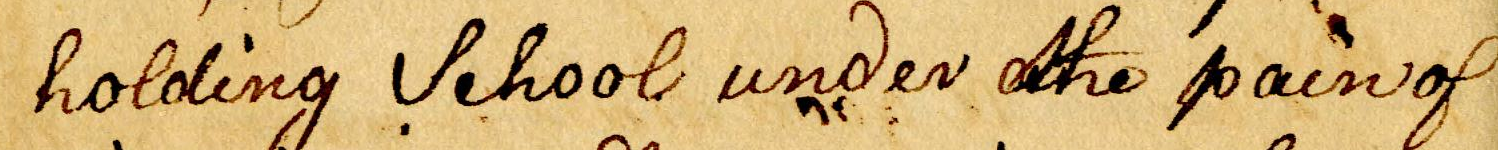holding School under the pain of
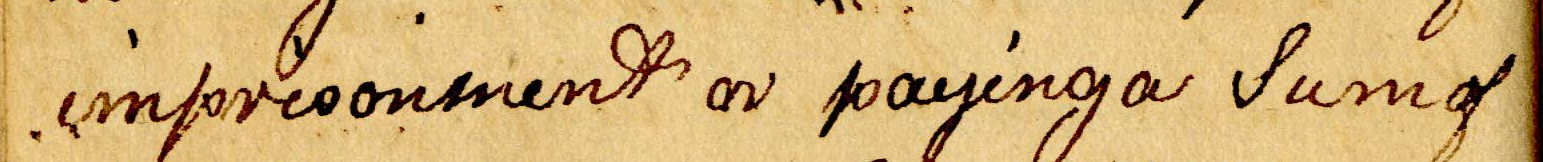imprisonment or paying a Sum of
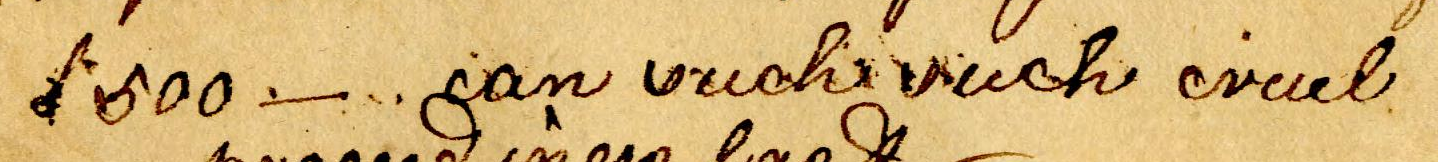£500- can such such cruel
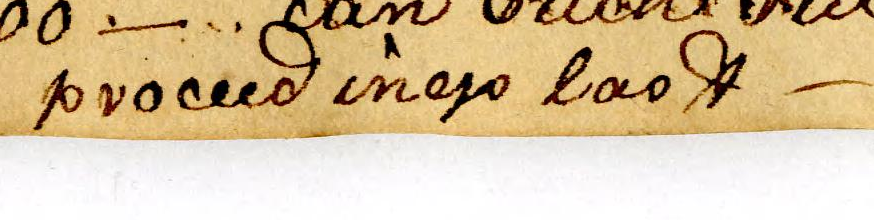proceed inep last
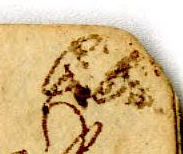65
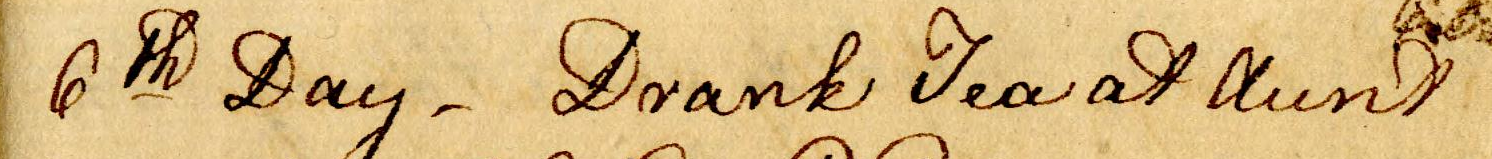6^th Day- Drank Tea at Aunt
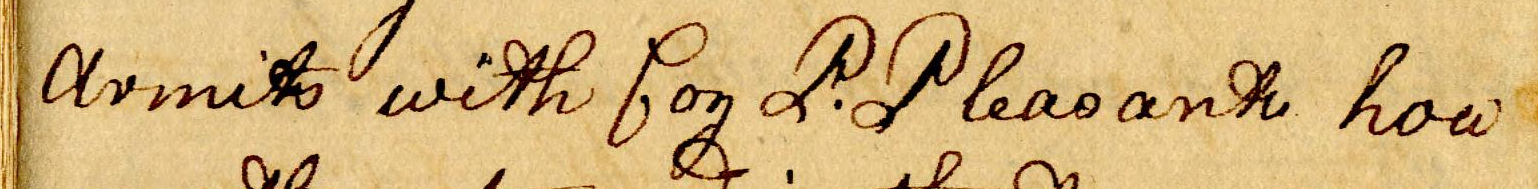Armits with Coz P. Pleasants how
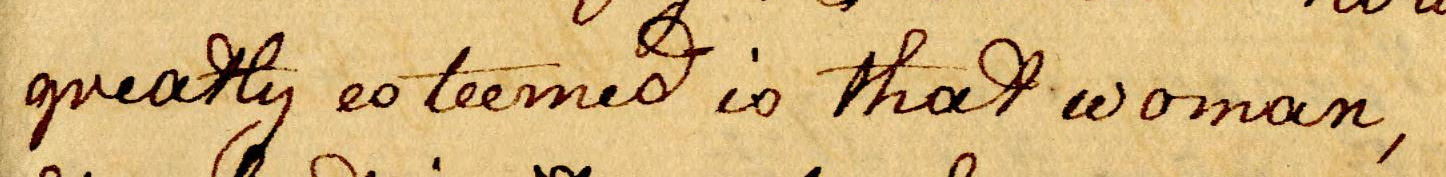greatly esteemed is that woman,
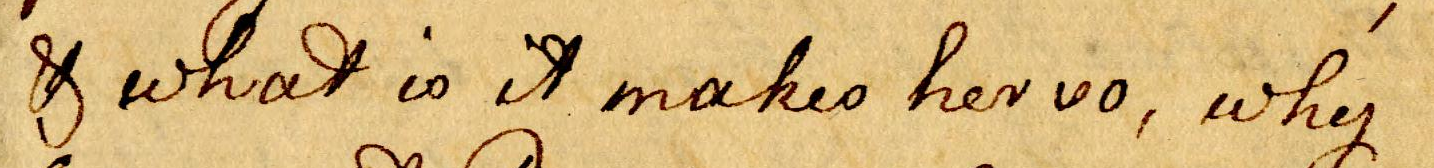& what is it makes her so, why
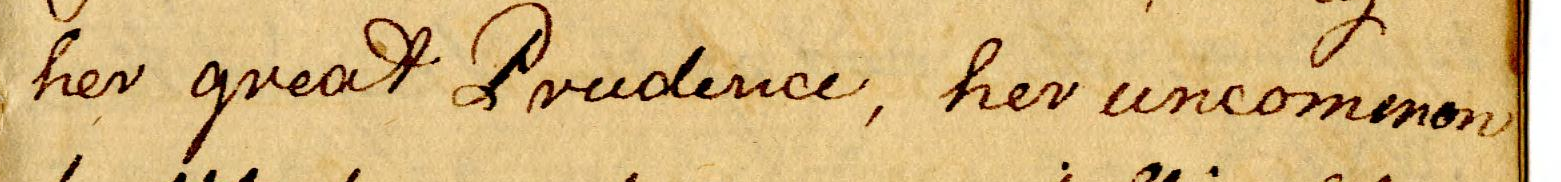her great Prudence, her uncommon
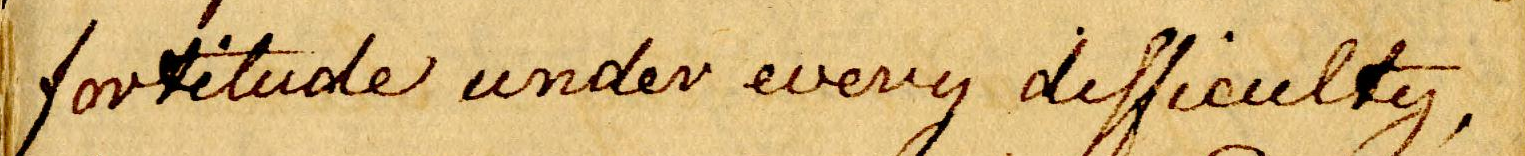fortitude under every difficuilty,
